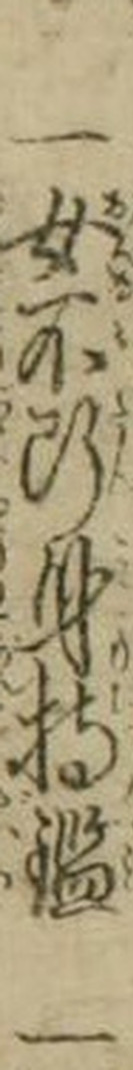一女不断身持鑑
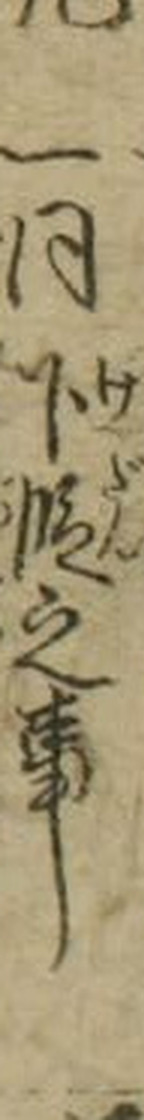一同下段之事
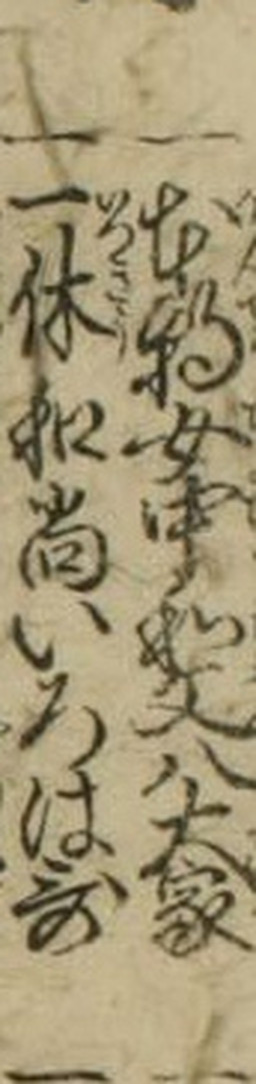一一休和尚いろは哥
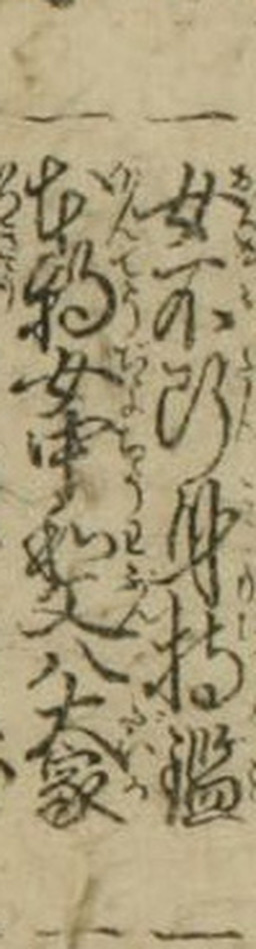一本朝女中和文八大家
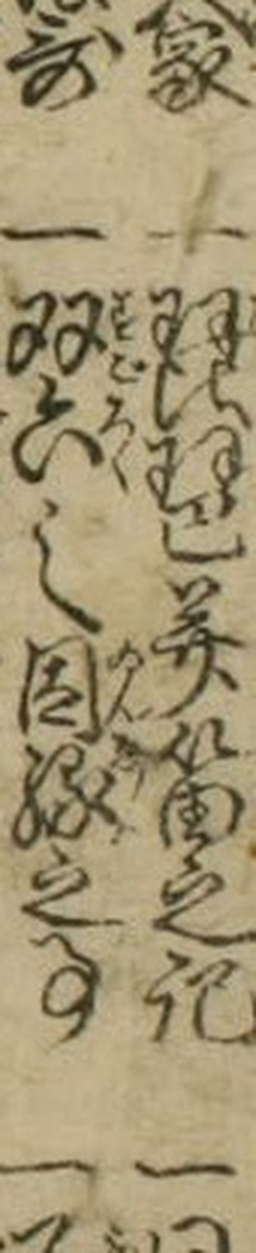一双六之因縁之事
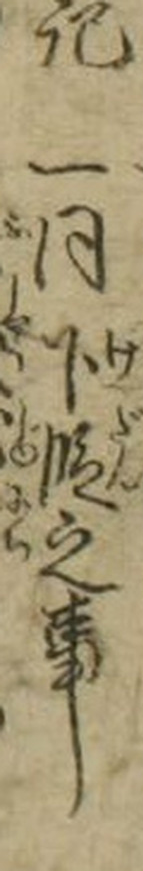一同下段之事
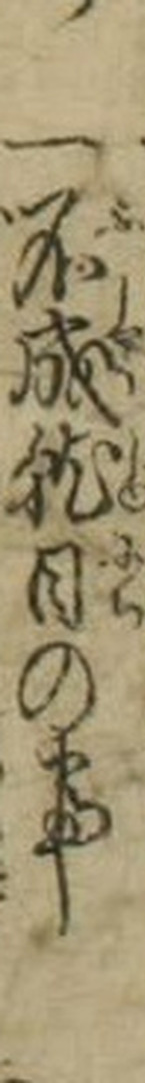一不成就日之事
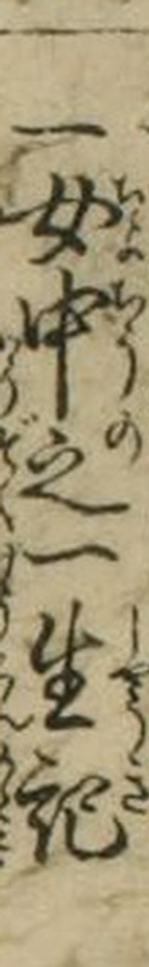一女中之一生記
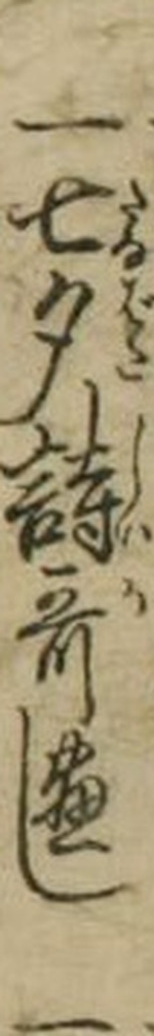一七夕詩歌尽し
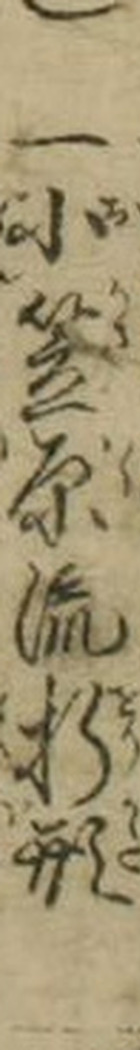一小笠原流折形
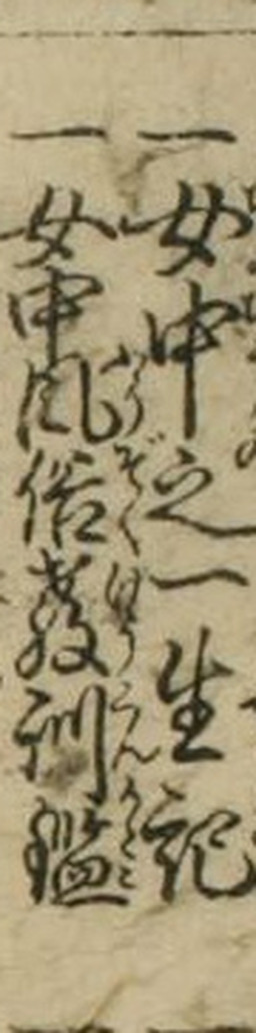一女中風俗教訓鑑
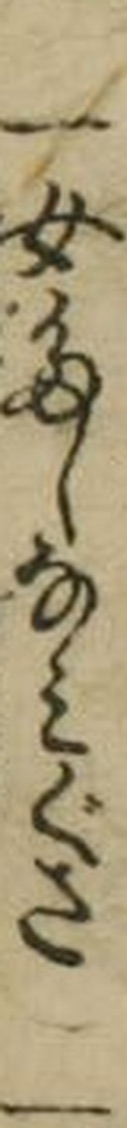一女たしなみぐさ
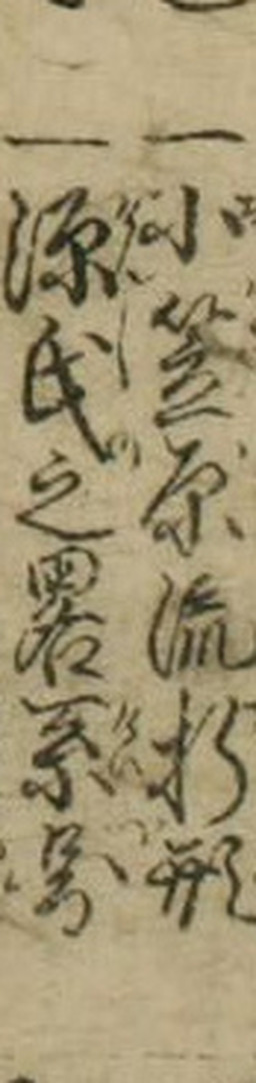一源氏之略系図
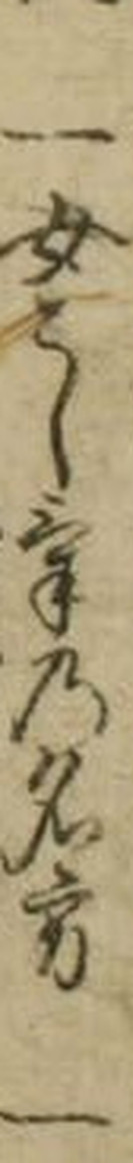一女こしけの名方
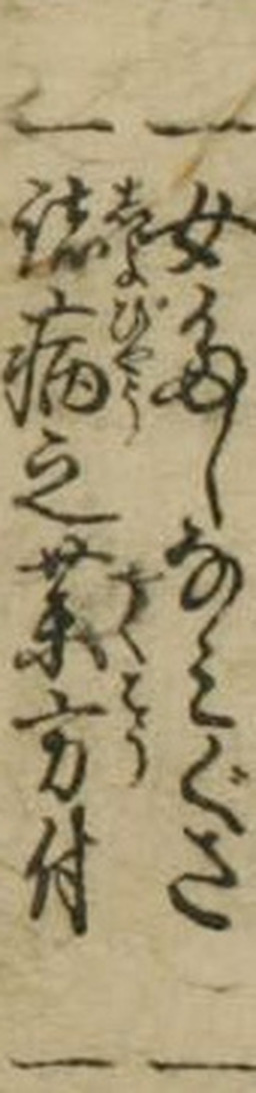一緒病之薬方付
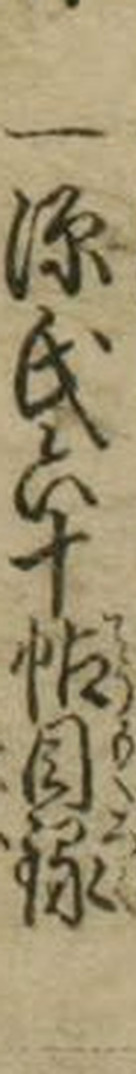一源氏六十帖目録
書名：女源氏教訓鑑
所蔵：東京学芸大学附属図書館
